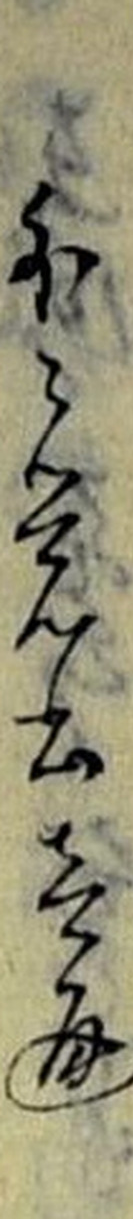外ニ覚書壱通
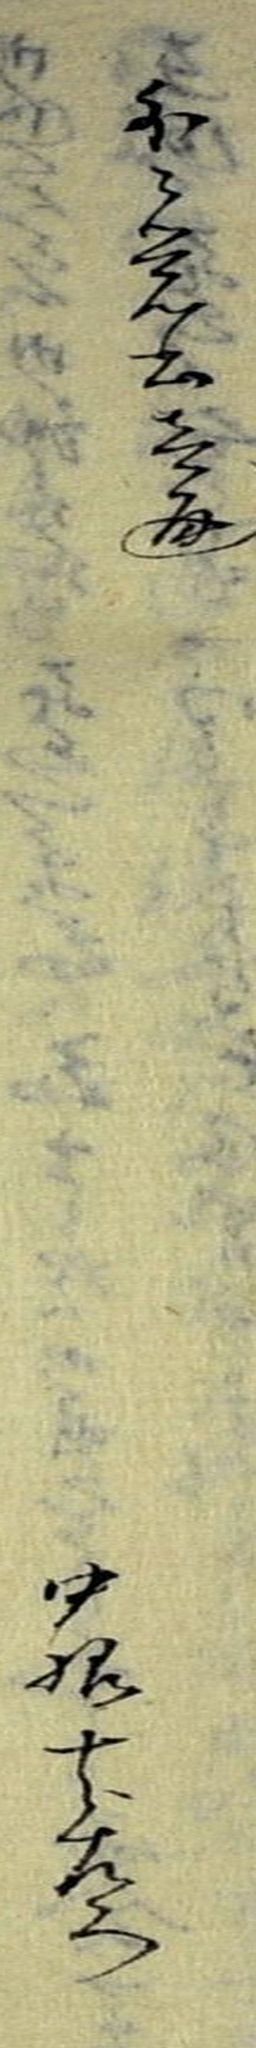中根十郎左衛門
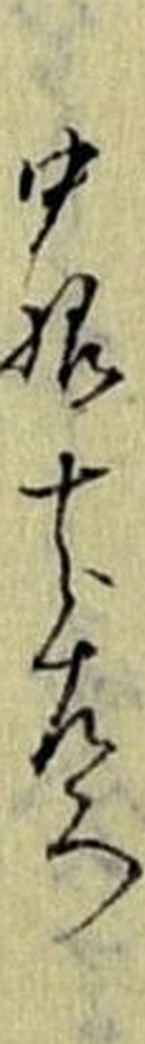中根十郎左衛門
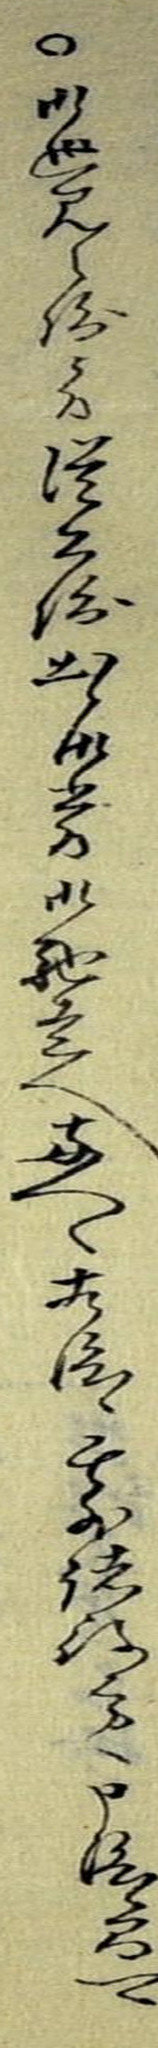〇御巡見之儀ニ付従公儀出候御書付御馳走人両人へ相渡候其外諸役方へ申渡候間可
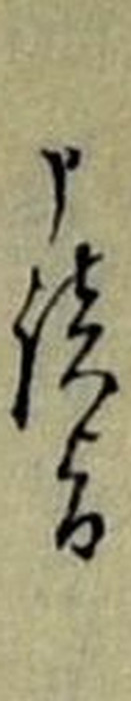申談旨
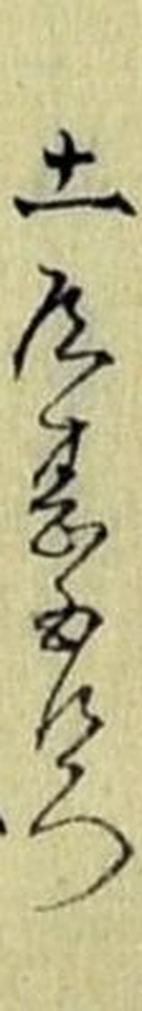土屋甚五左衛門
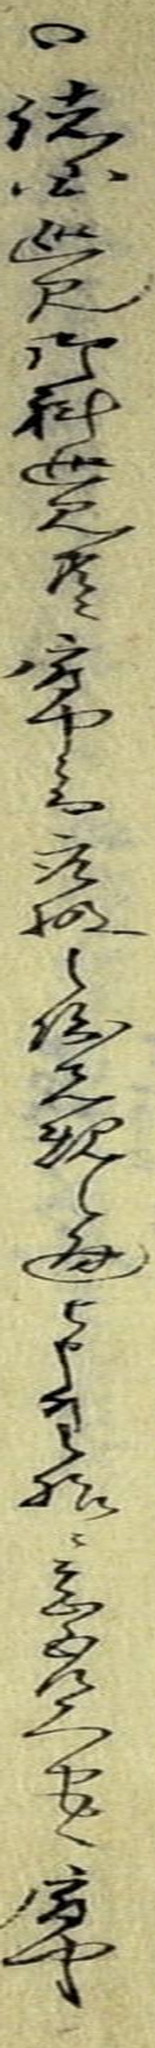〇諸国巡見御料巡見共ニ府中ニ而取扱之儀先規之通被申付候様ニ甚五左衛門宅へ府中
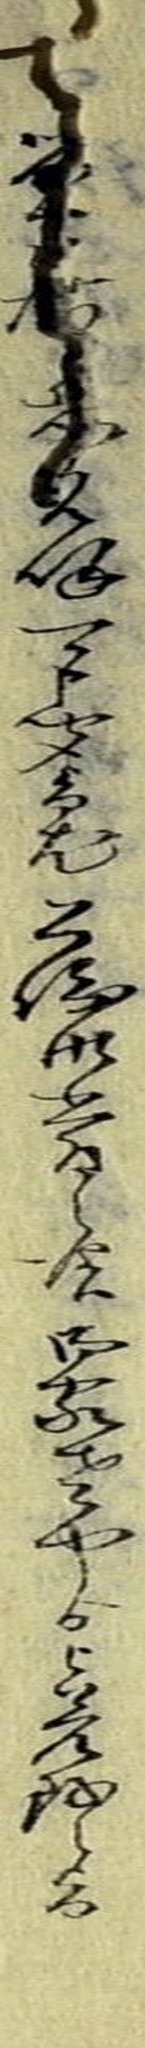留守居之者召呼可申聞旨尤公儀御書付之儀ハ御家老中ゟ被差越候旨
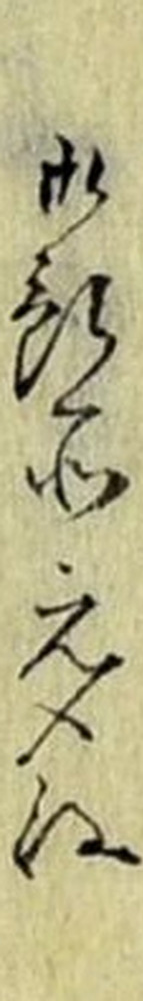御預所元〆役
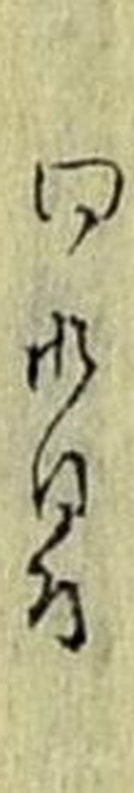同御目付
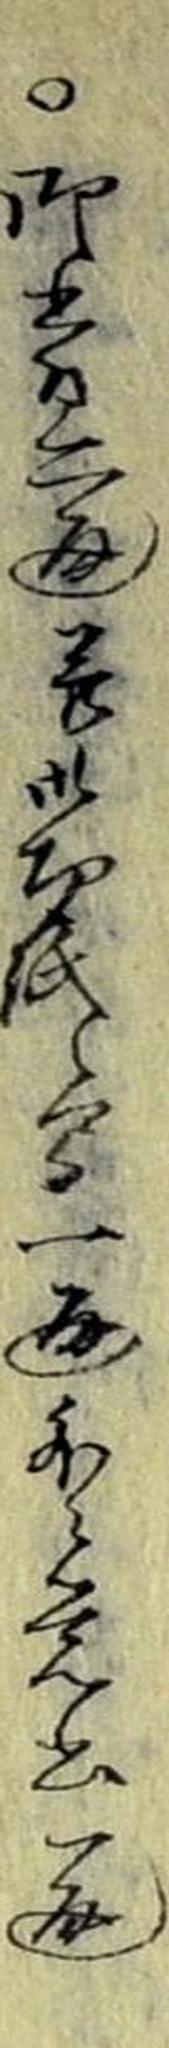〇御書付二通并御切紙之写一通外ニ覚書一通
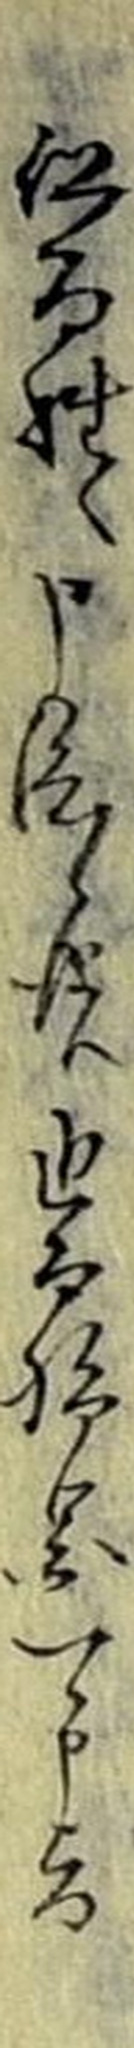但百姓へ申渡候儀ハ追而指図可申旨
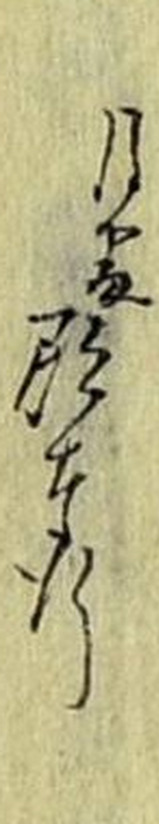町奉行
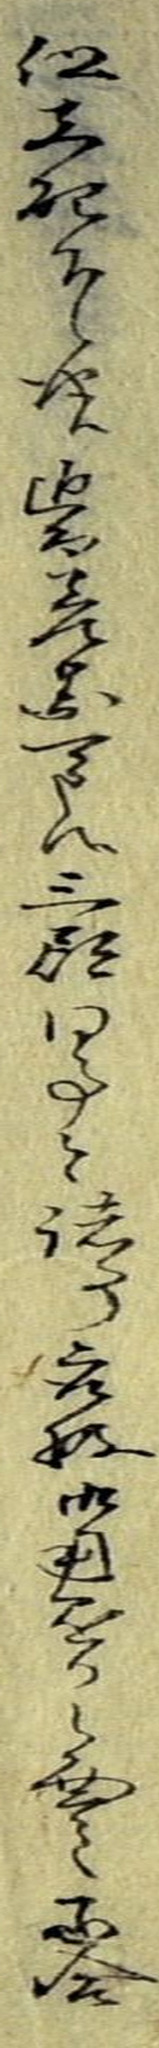但支配下之儀ハ追而差図可申候三郡同事ニ候諸事取扱御用懸り之面々承合

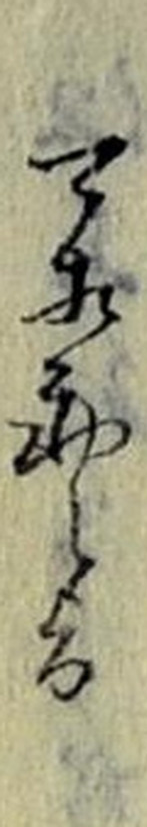可相勤候旨
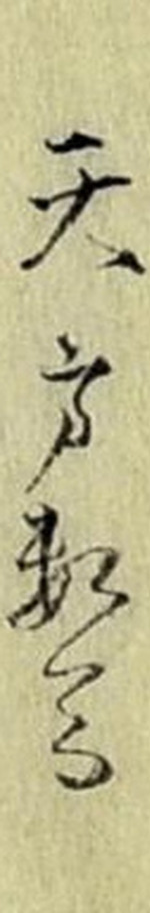天方数馬
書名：命令之部 一
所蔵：福井県文書館 Fukui Prefectural Archives
